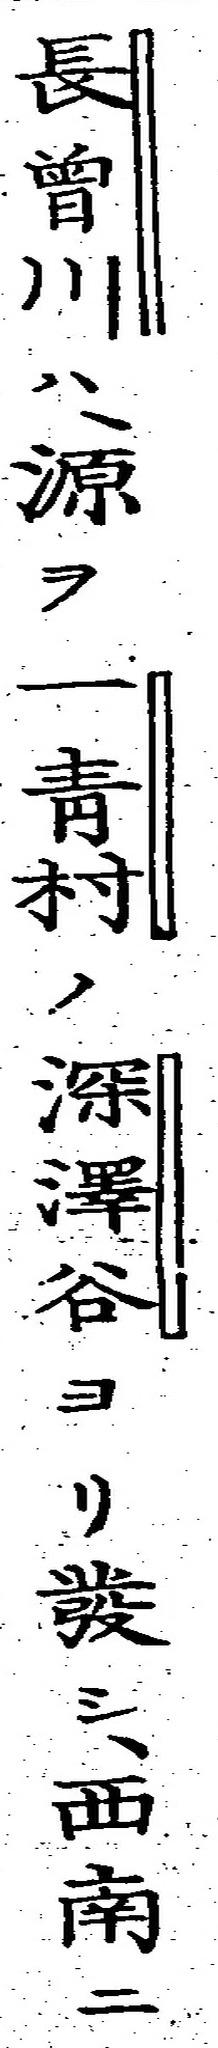長曽川ハ、源ヲ一青村ノ深沢谷ヨリ発シ、西南ニ
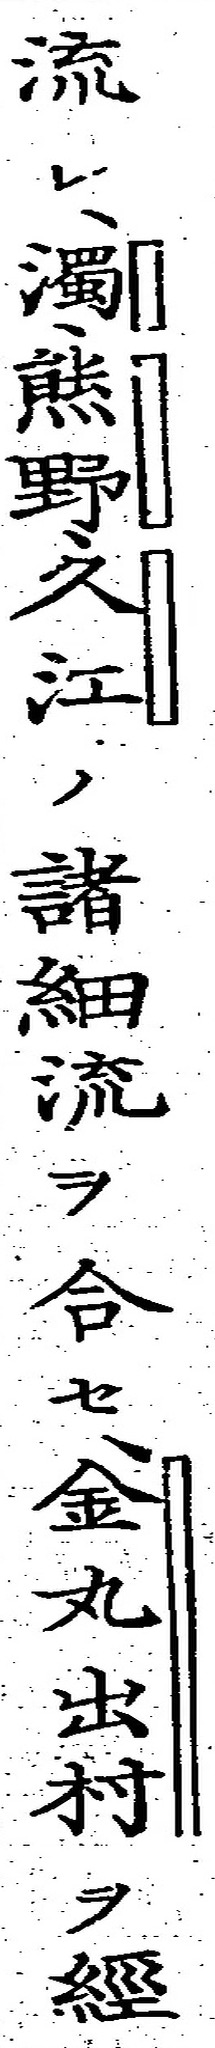流レ、濁・熊野・久江ノ諸細流ヲ合セ、金丸出村ヲ経
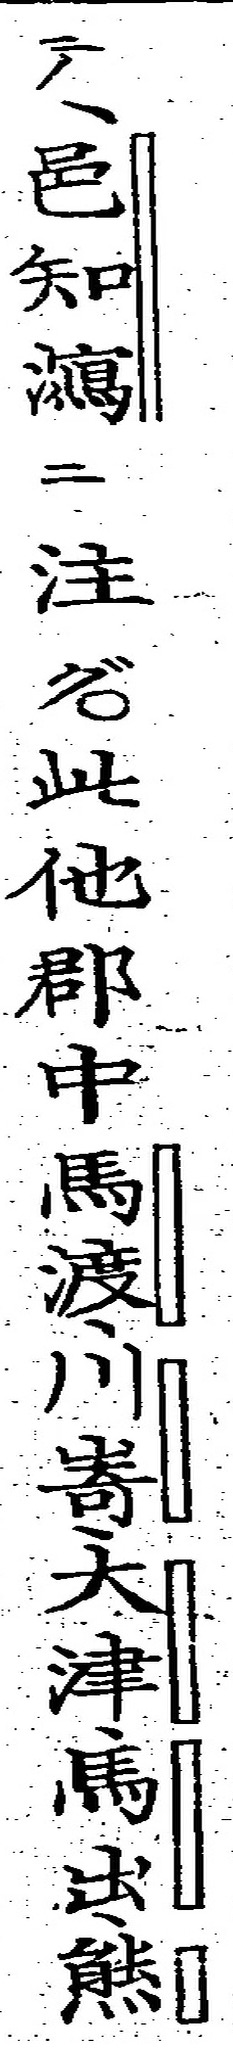テ、邑知瀉ニ注グ。此他郡中馬渡・川崎・大津・馬出・熊
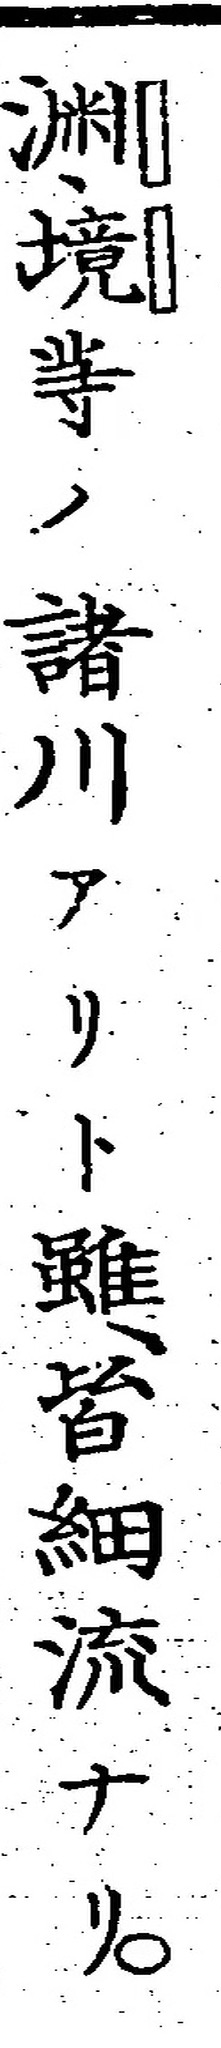淵・境等ノ諸川アリト雖、皆細流ナリ。
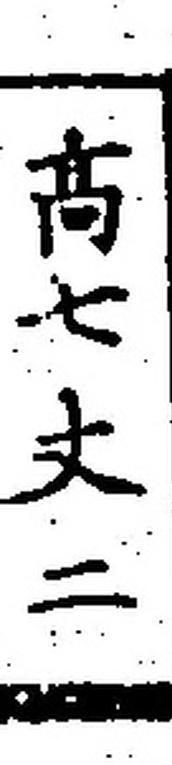高七丈二
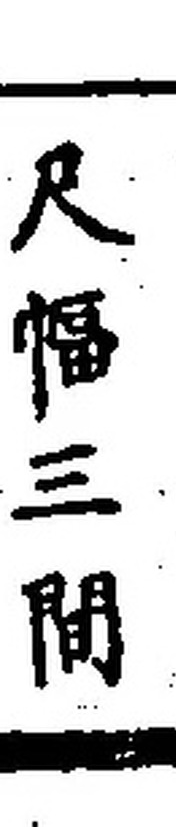尺幅三間
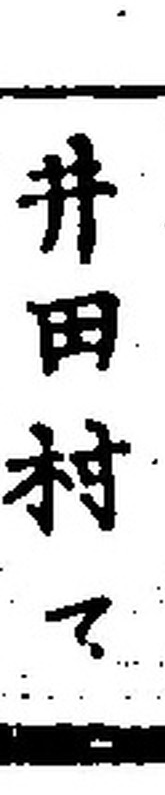井田村マ
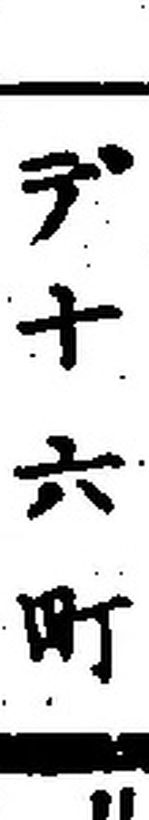デ十六町
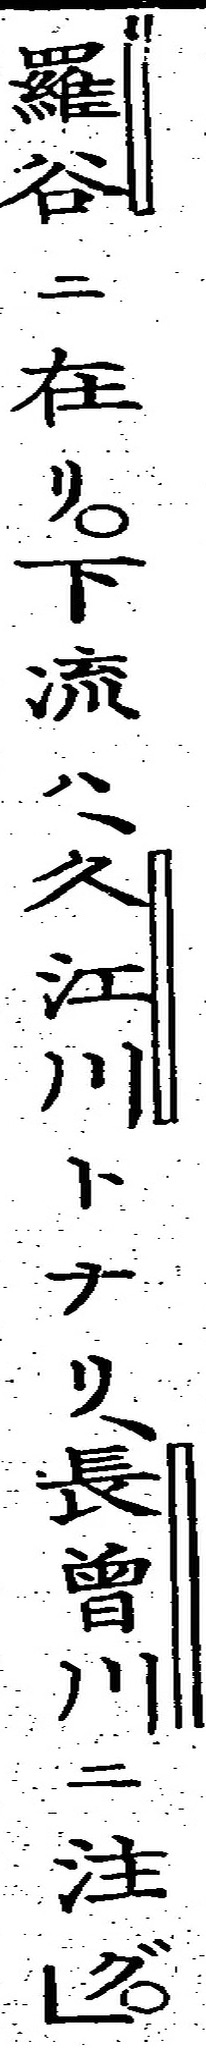羅谷ニ在リ。下流ハ、久江川トナリ、長曽川ニ注グ。」
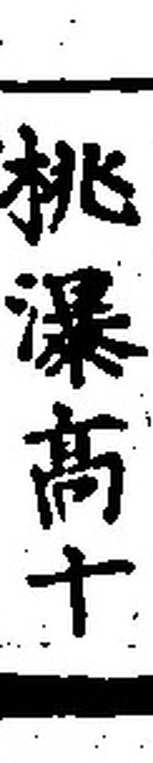桃瀑高十
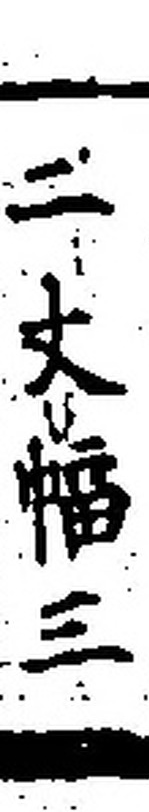二丈幅三
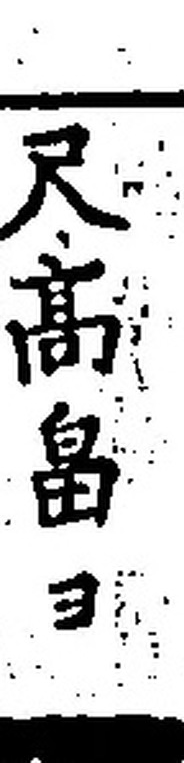尺高畠ヨ
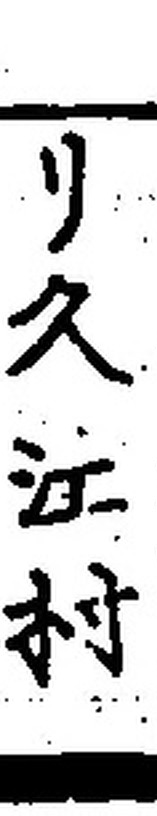リ久江村
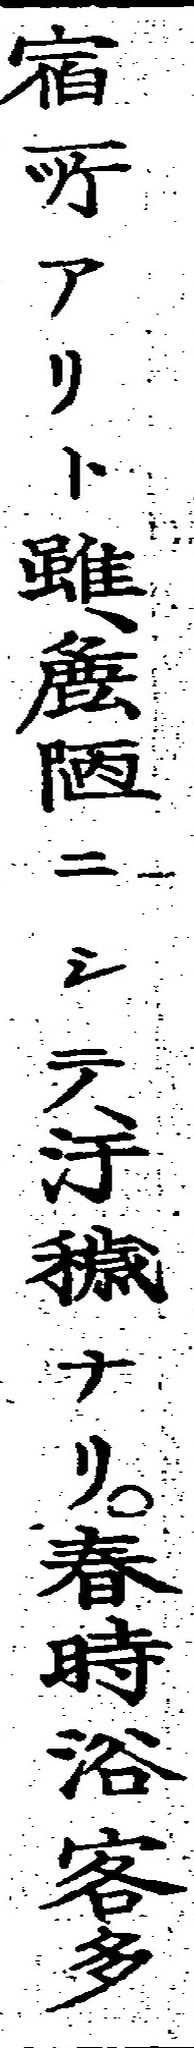宿所アリト雖、麤陋ニシテ、汚穢ナリ。春時浴客多
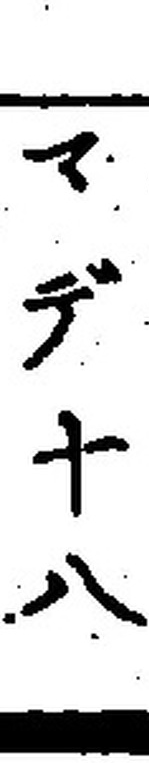マデ十八
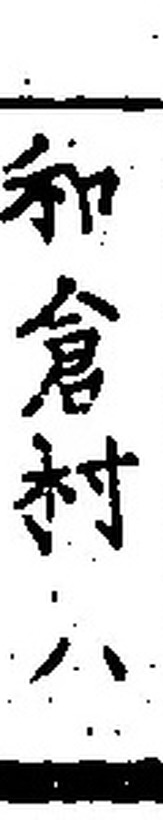和倉村ハ
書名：能登地誌略
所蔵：国立国会図書館 National Diet Library, JAPAN
